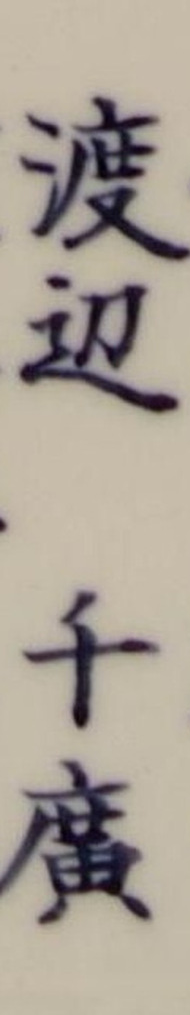渡辺千広
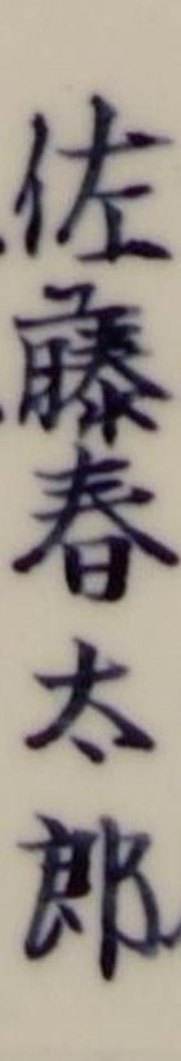佐藤春太郎
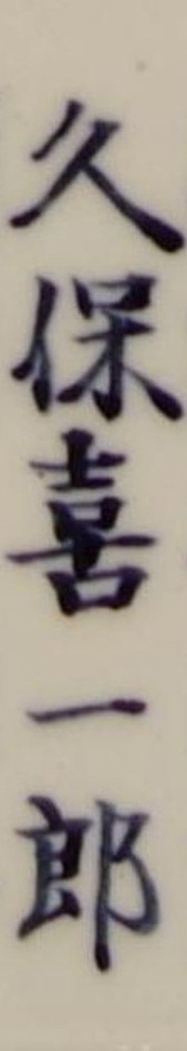久保喜一郎
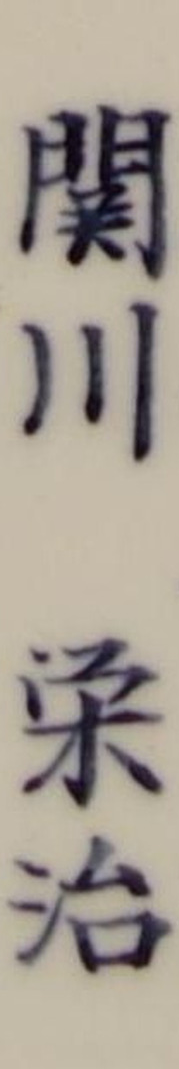関川栄治
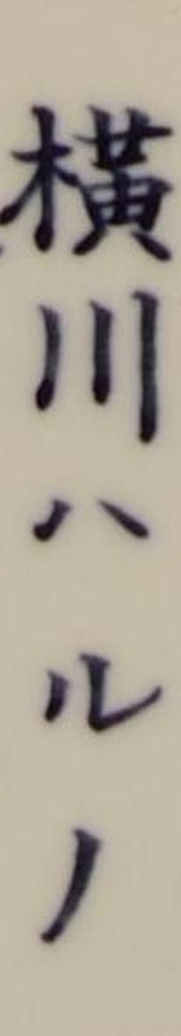横川ハルノ
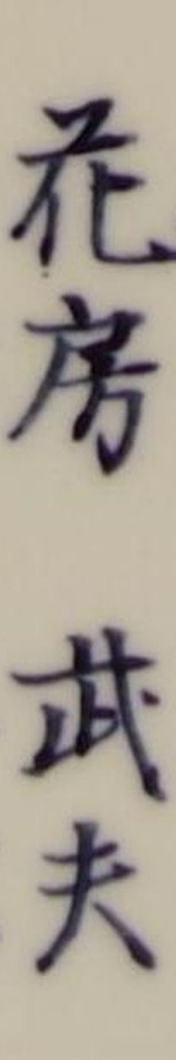花房武夫
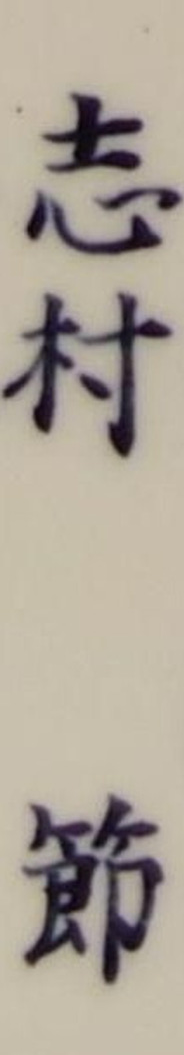志村節
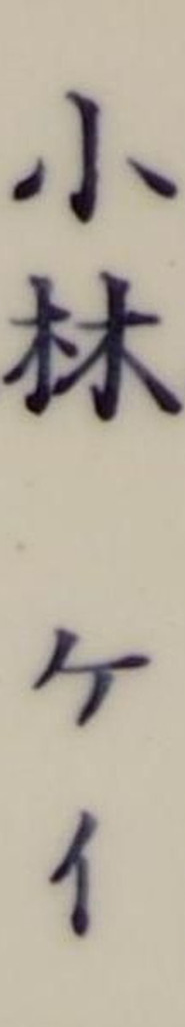小林ケイ
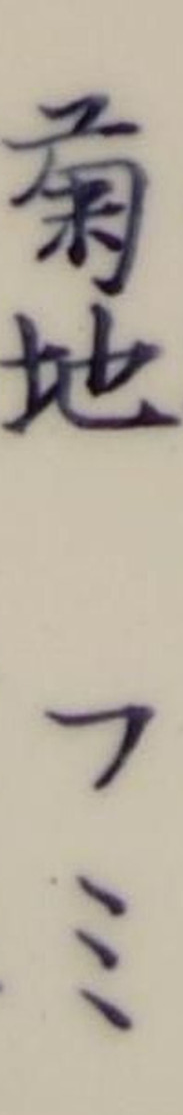菊地フミ
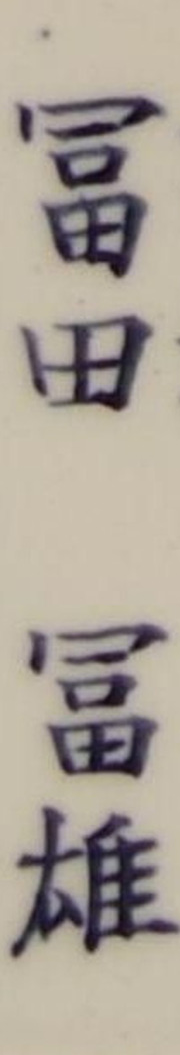冨田冨雄
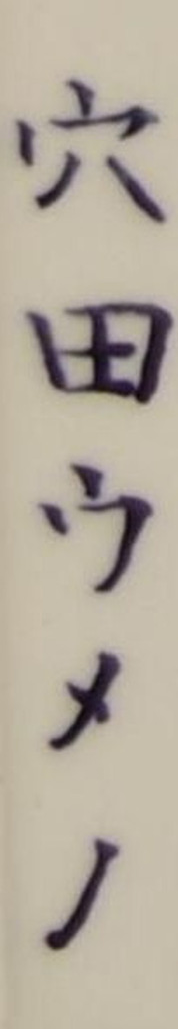穴田ウメノ

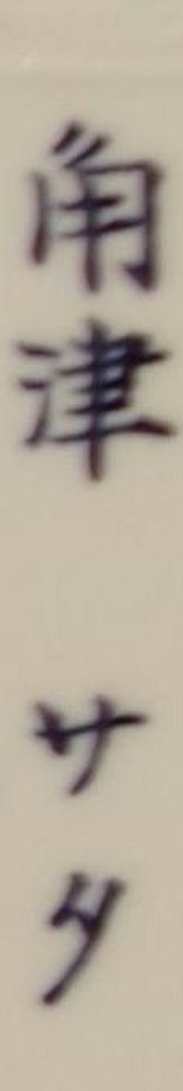角津サタ
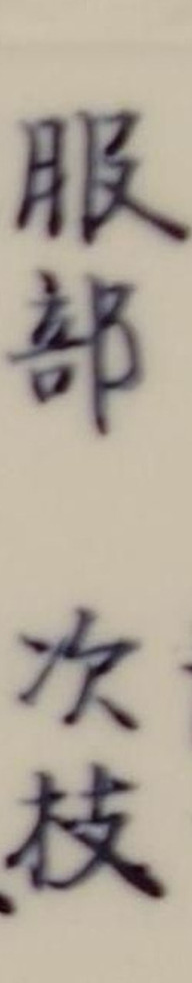服部次枝
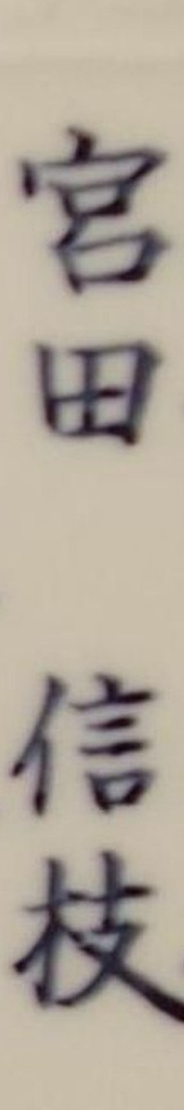宮田信枝
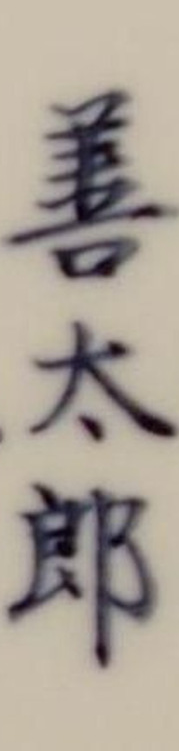善太郎
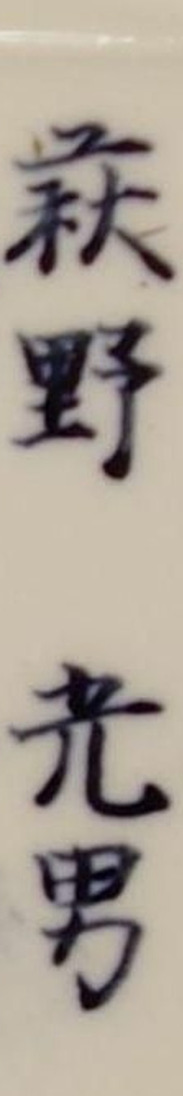萩野光男
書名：M~S
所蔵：高野山金剛峯寺
